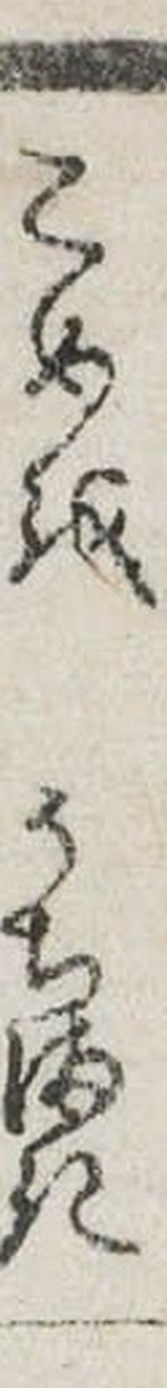こめをうちまき
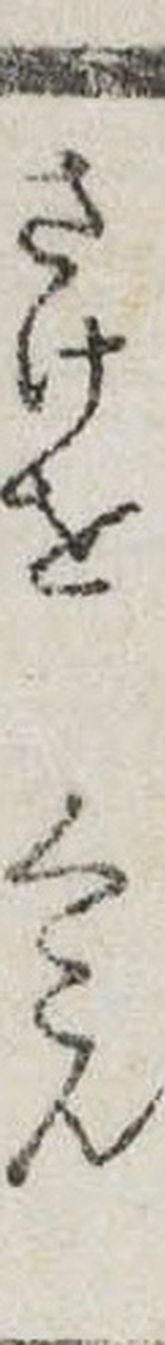さけをくこん
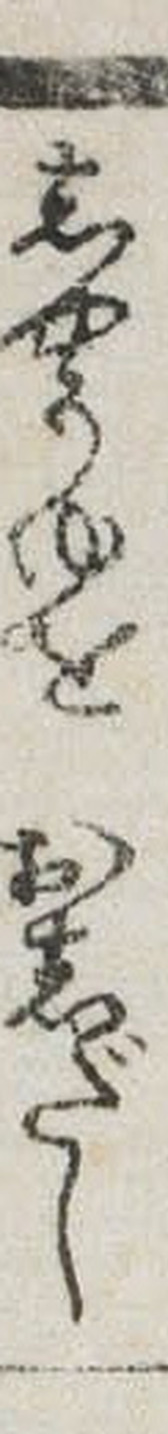しやうゆをおしだし
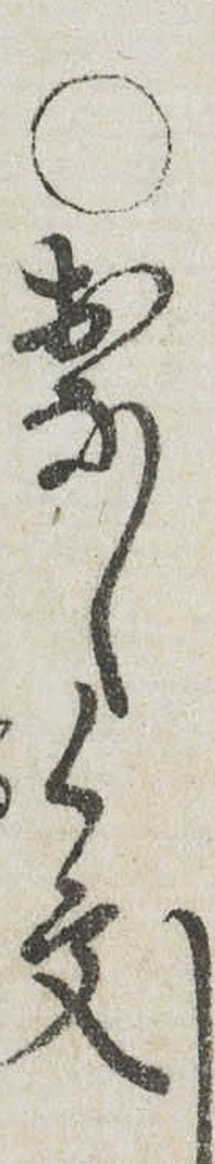○おなしく文
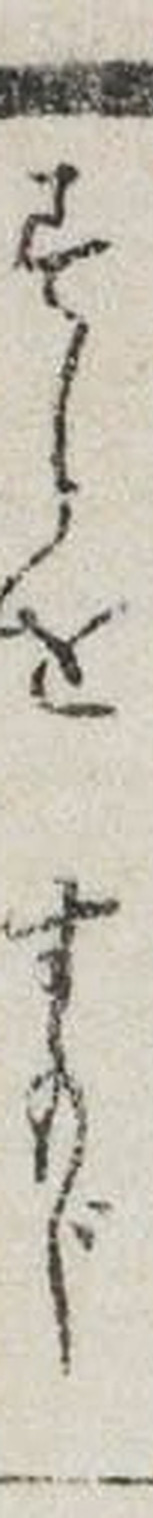すしをすもじ
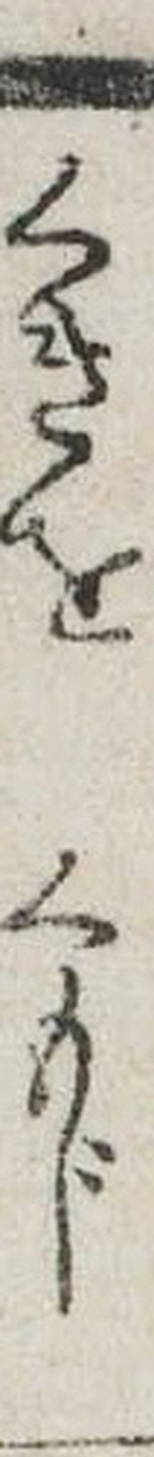くきをくもじ
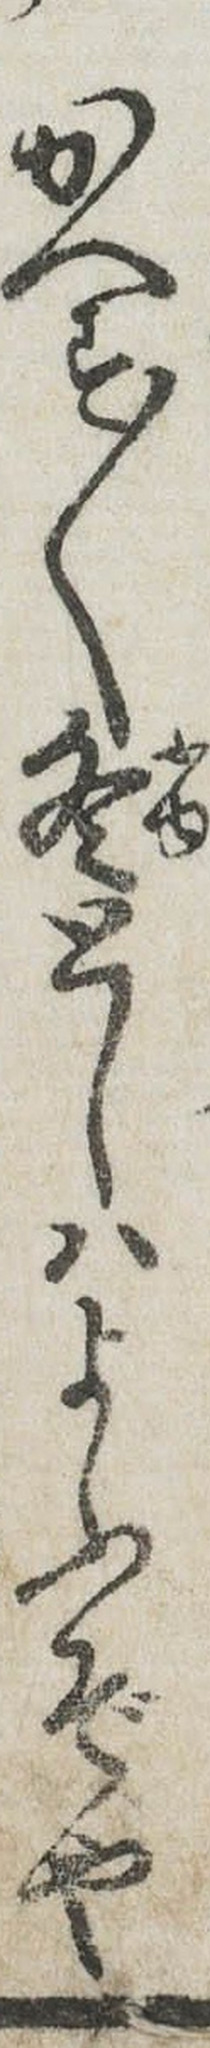かへす〳〵冬としはよふぞや
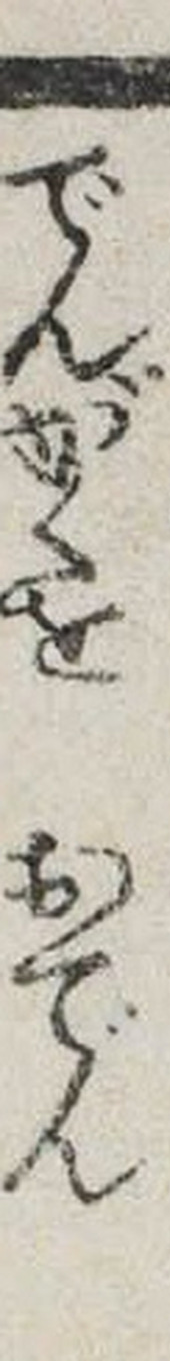でんがくをおでん
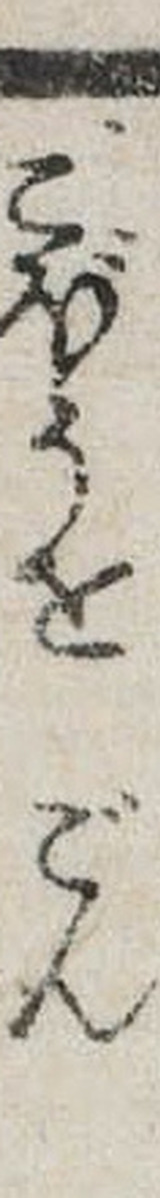こぼうをごん
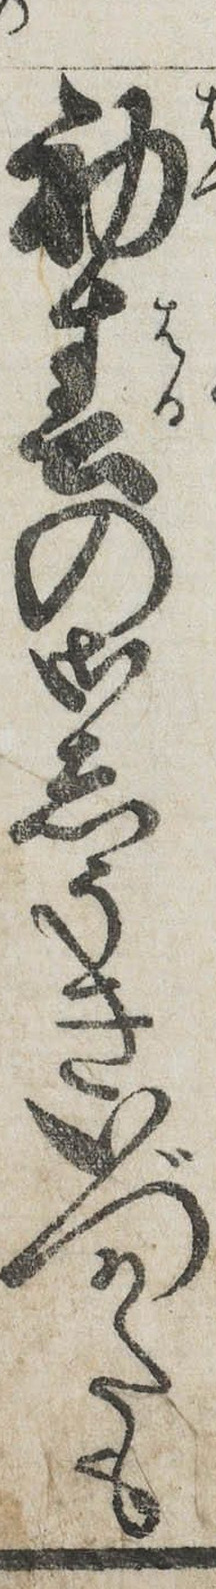初春の御しうきいづかたも
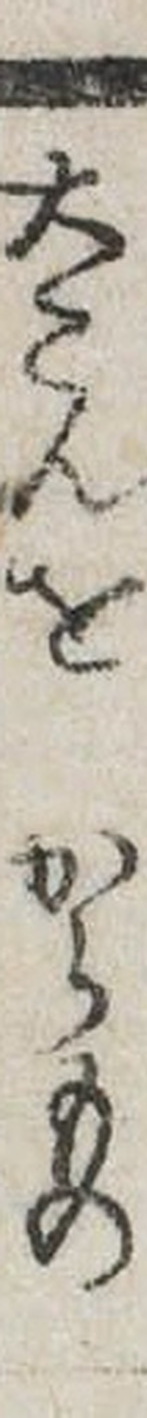大こんをからもの
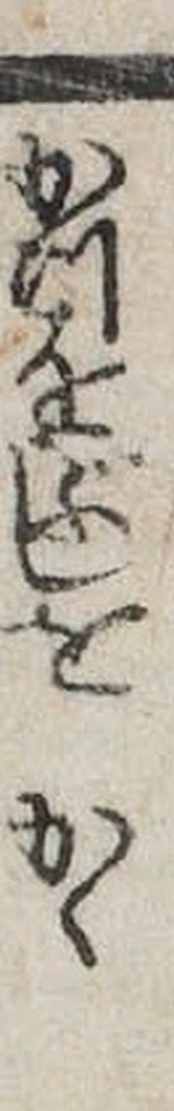かつをぶしをかゝ
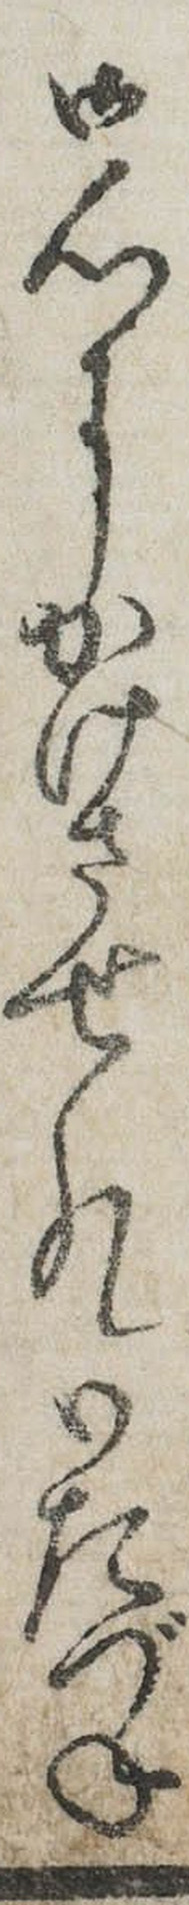御心にかけさせられ御たづね
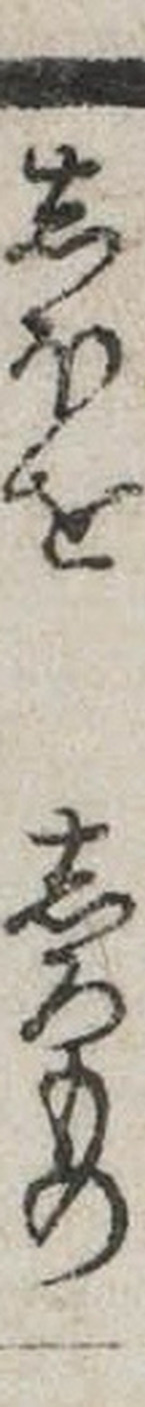しほをしろもの
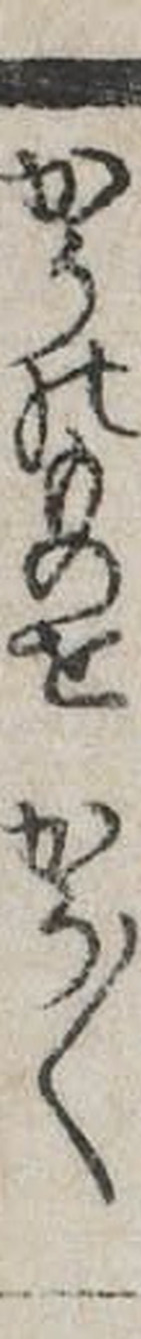かうのものをかう〳〵
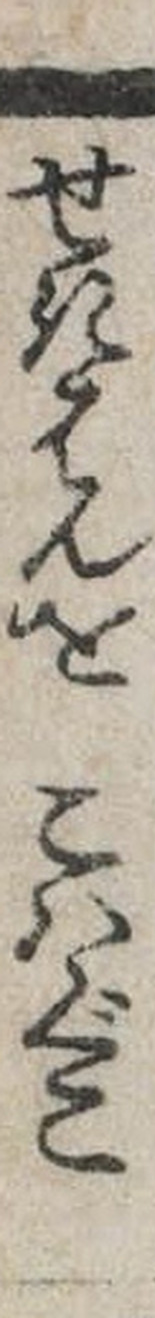せきはんをこはぐこ
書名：頭書萬用婦人手紙之文言
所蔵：東京学芸大学教育コンテンツアーカイブ
